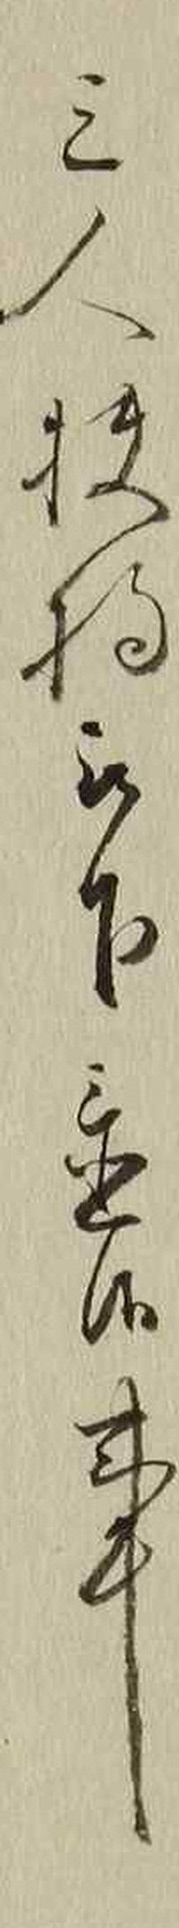三人扶持被下置候事
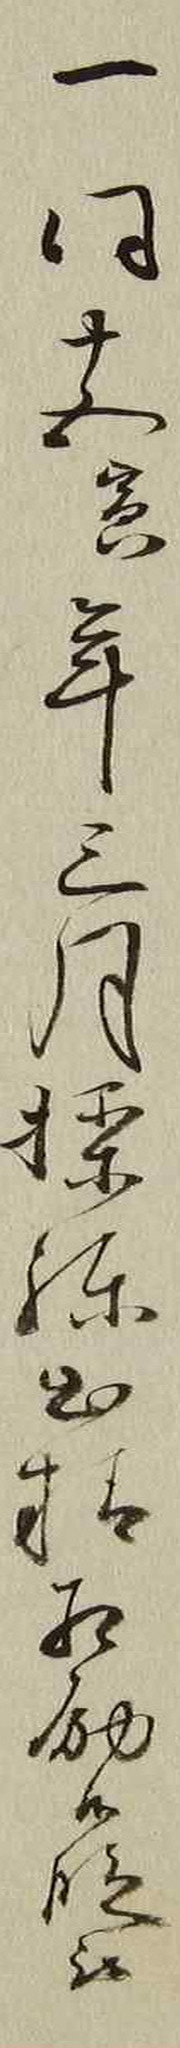一同十五寅年三月操練出精相励候段被
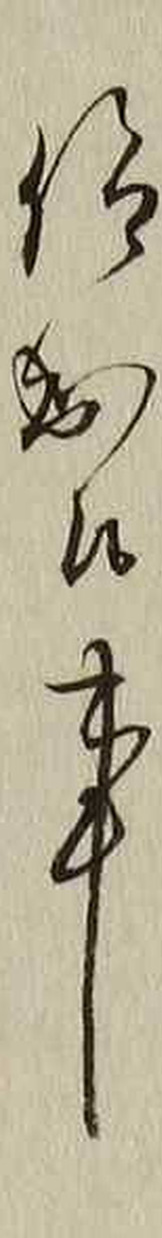仰出候事
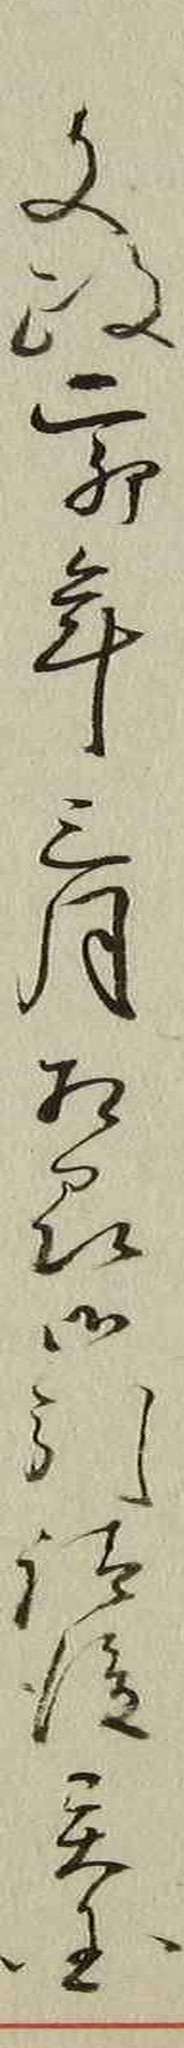一文政二卯年三月相州御引請後異国
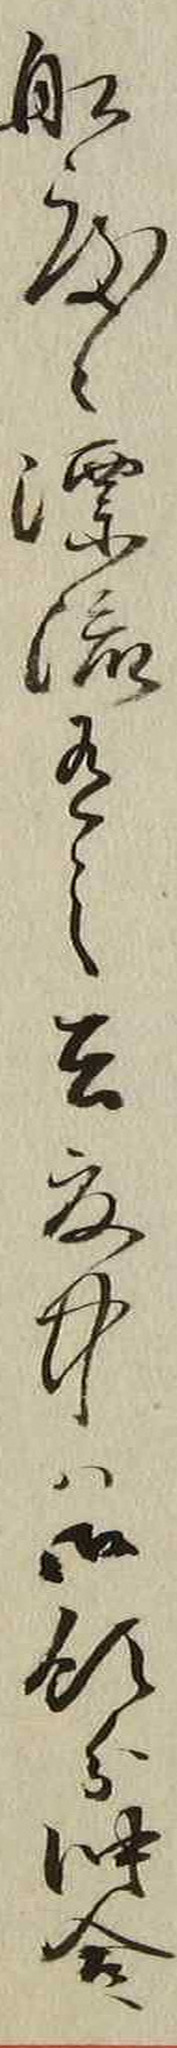船度々漂流有之去夏中は御領分沖合へ
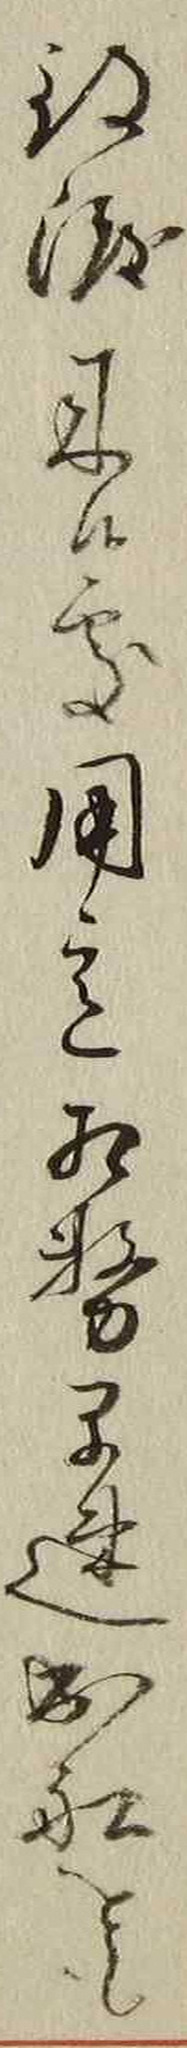致渡来候処用意相務早速出船をも
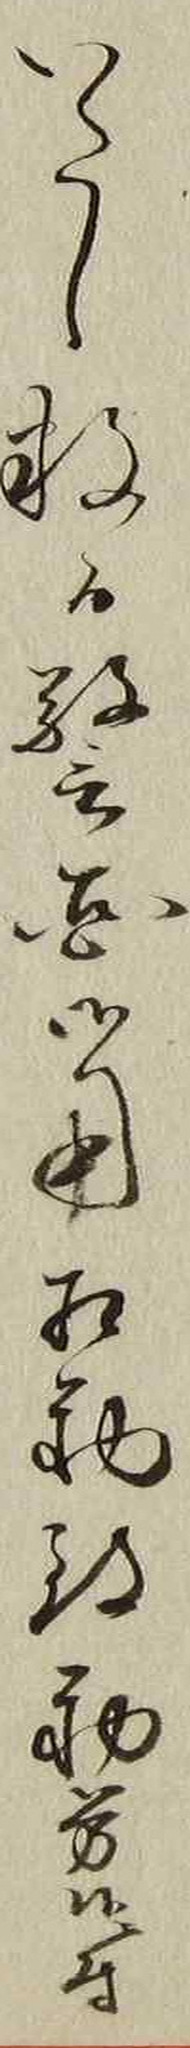いたし数日警固御用相勤致勤労候に付
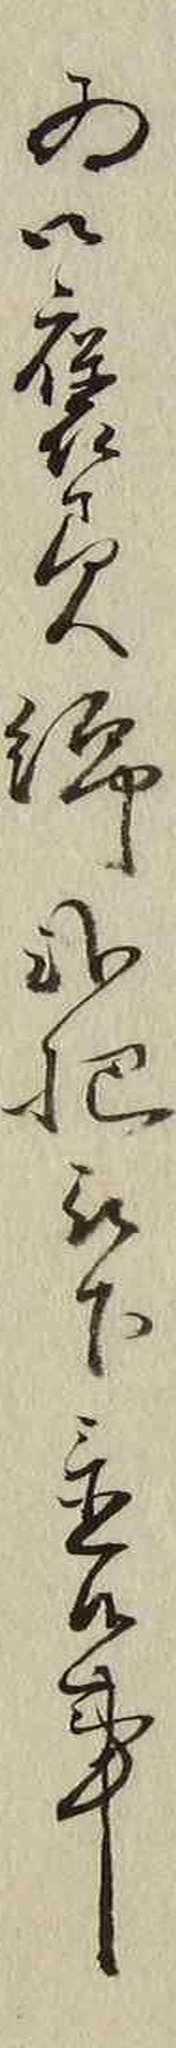為御褒美綿弐把被下置候事
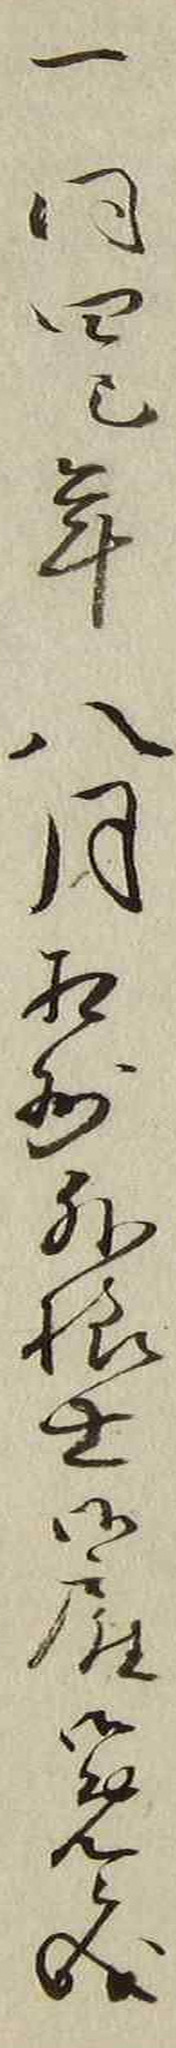一同四巳年八月相州外様士御雇御免被成
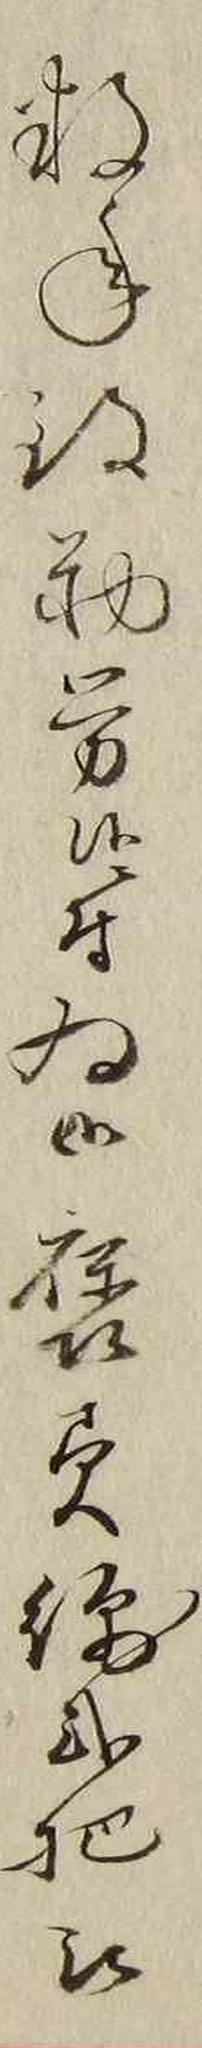数年致勤労候に付為御褒美綿二把被
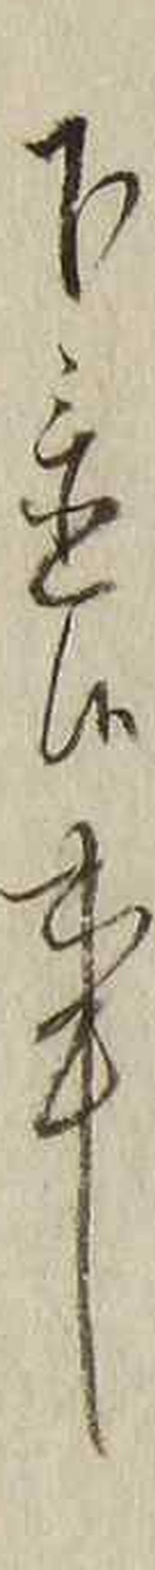下置候事

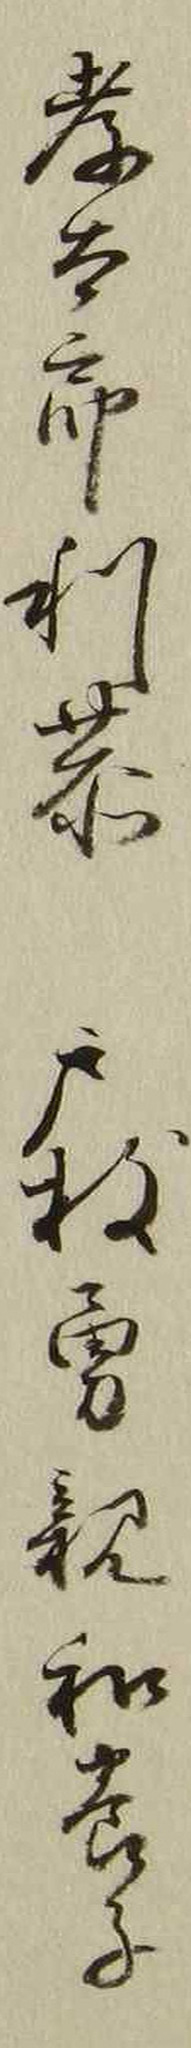孝太郎利保恭戸枝勇親和養子
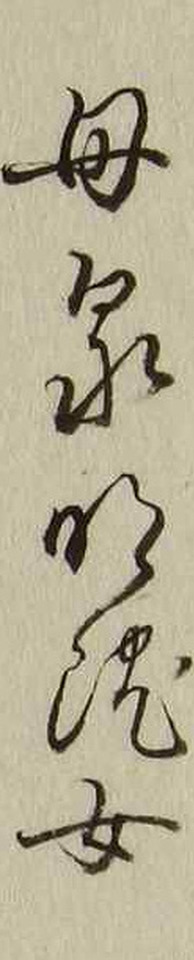母泉明院女
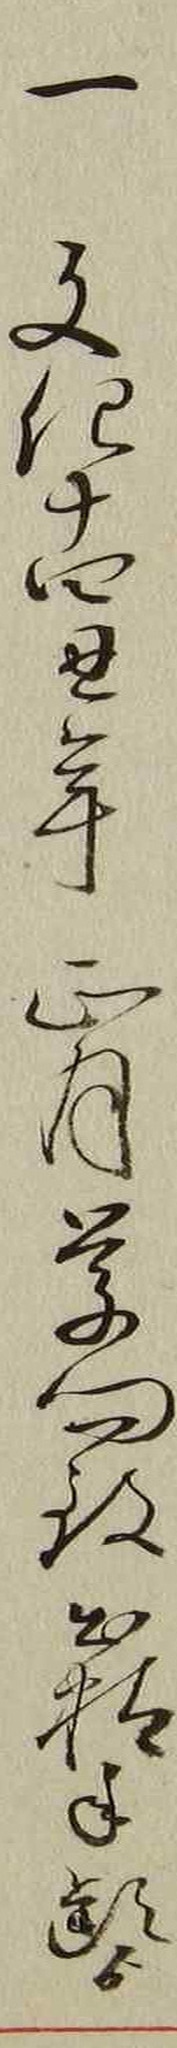一文化十四丑年正月学問致出精年齢ゟ
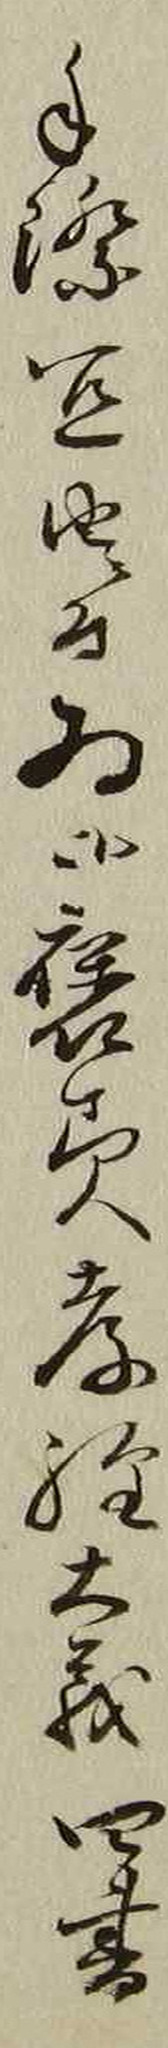手際宜由に付為御褒美孝経大義四書
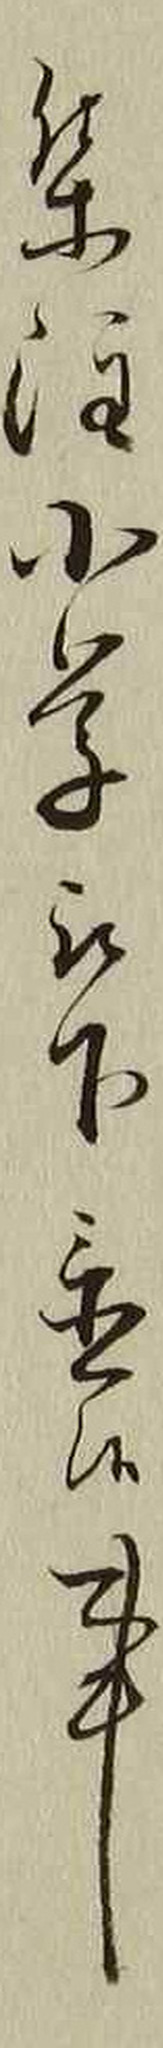集注小学被下置候事
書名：諸士系譜　巻之3　い之部3
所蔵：会津若松市立会津図書館
